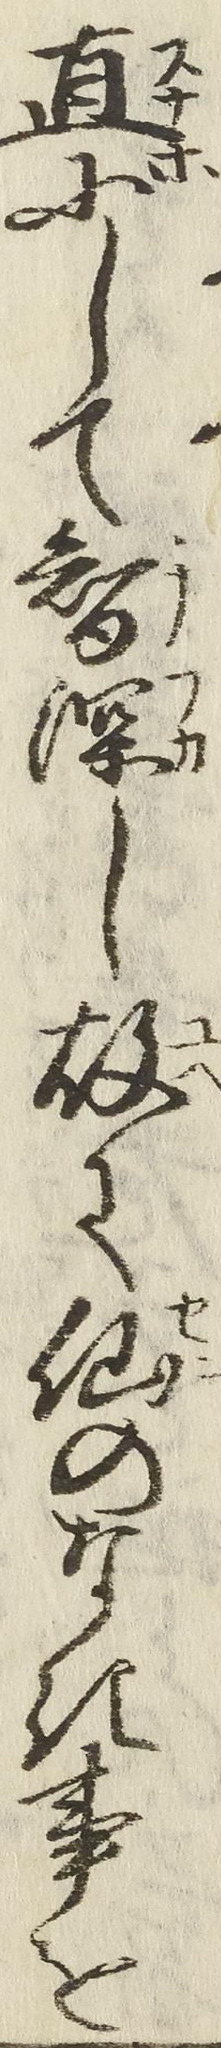直にして智深し故に仙のなき事を
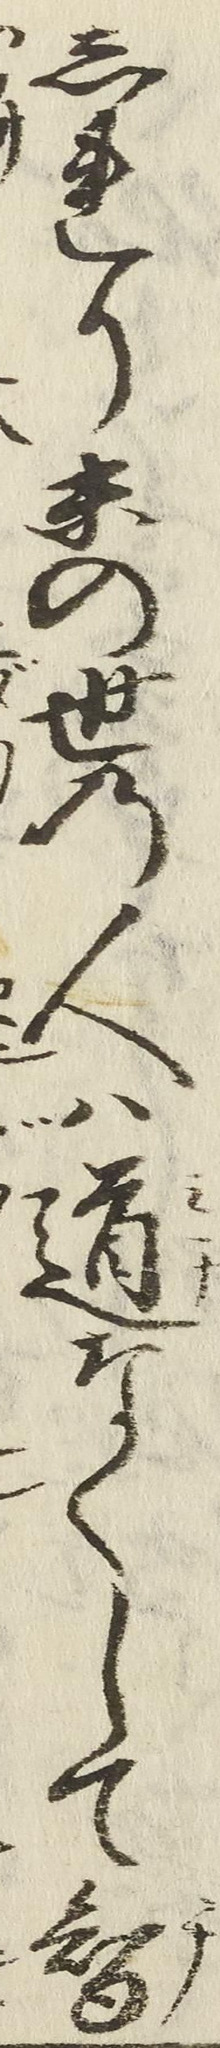しれり末の世の人は道なくして智
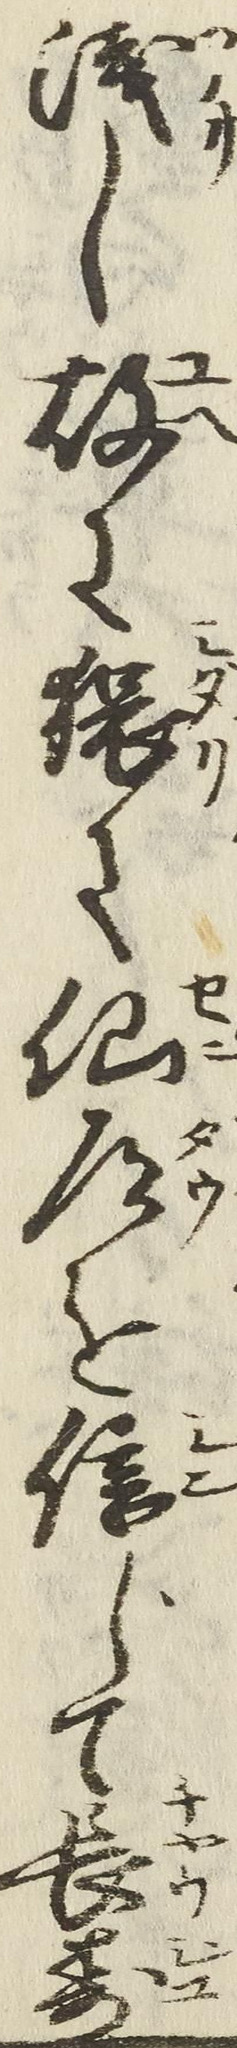浅し故に猥に仙道を信じて長寿
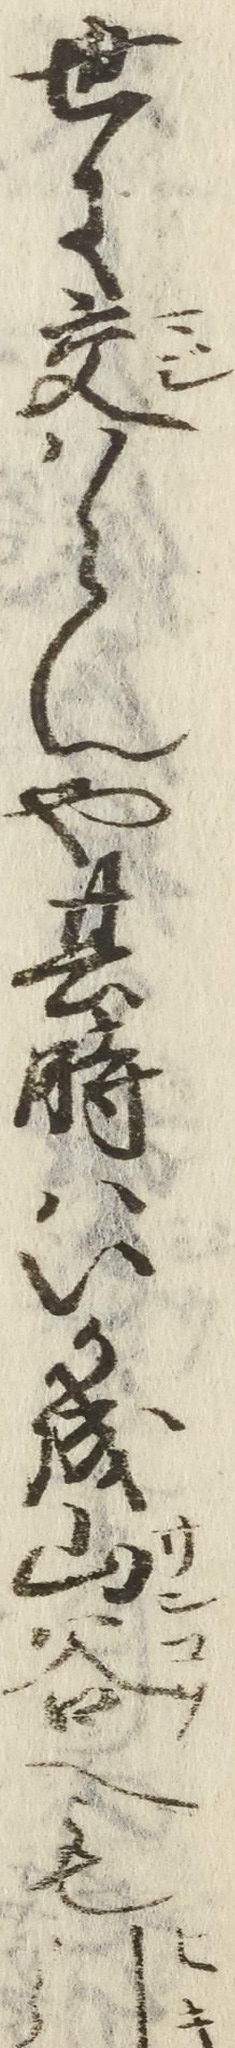世に交はらんや其時はいか成山谷へも引
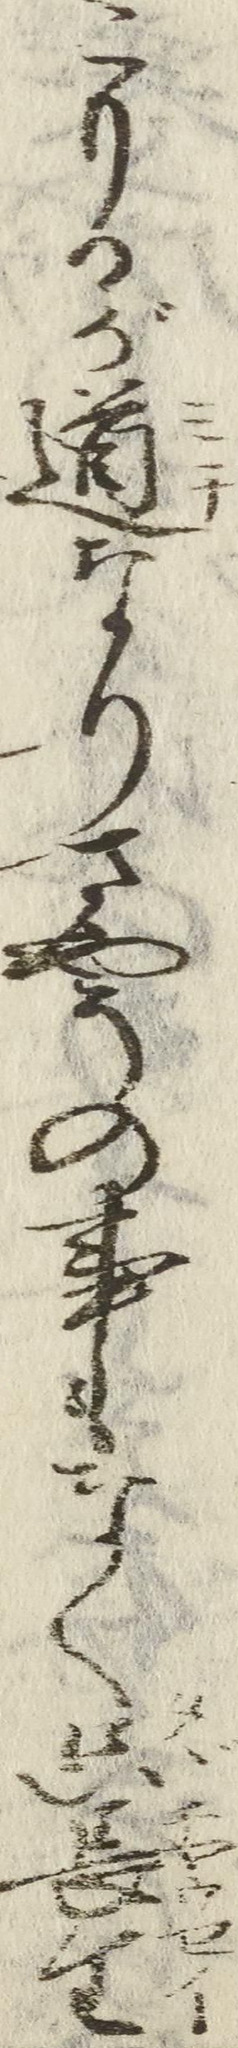こもるが道なりさやうの事もなく只長生
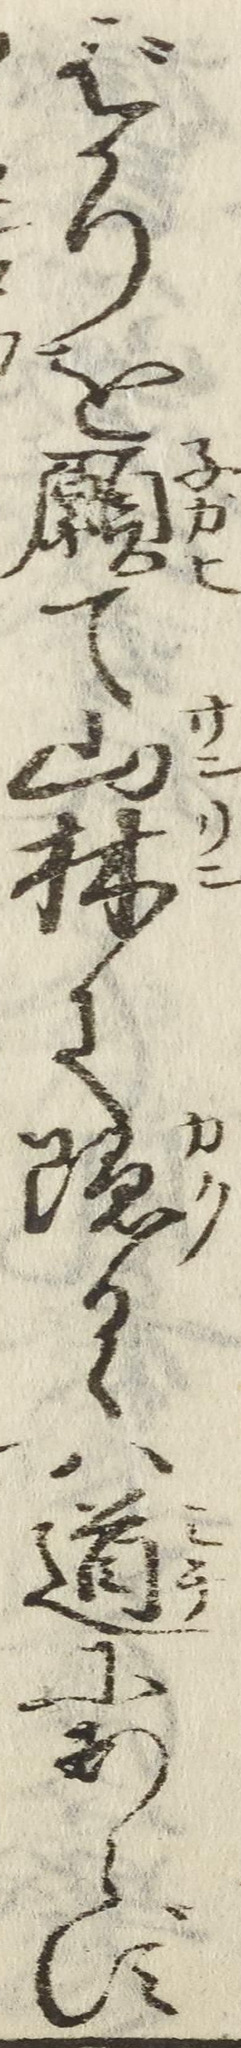ばかりを願て山林に隠るゝは道にあらず
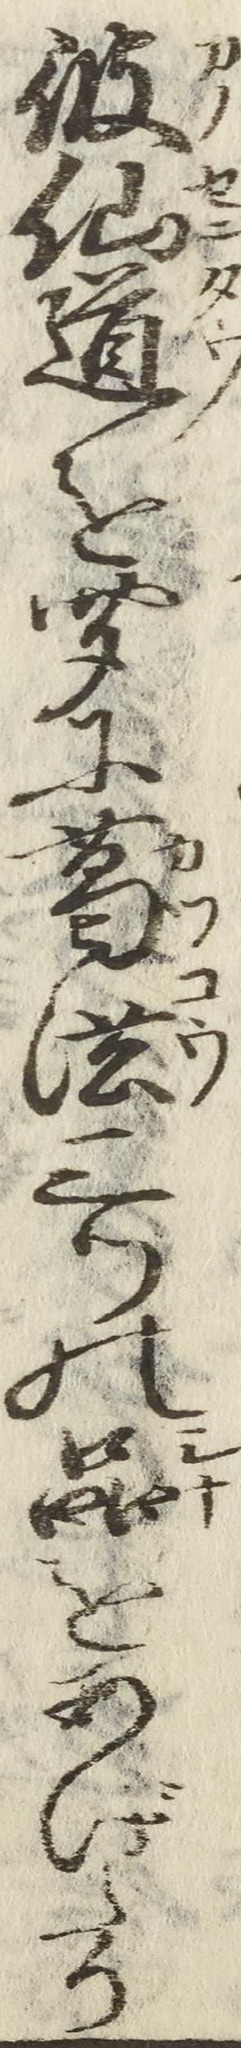彼仙道を聞に葛洪三つの品をあげたり
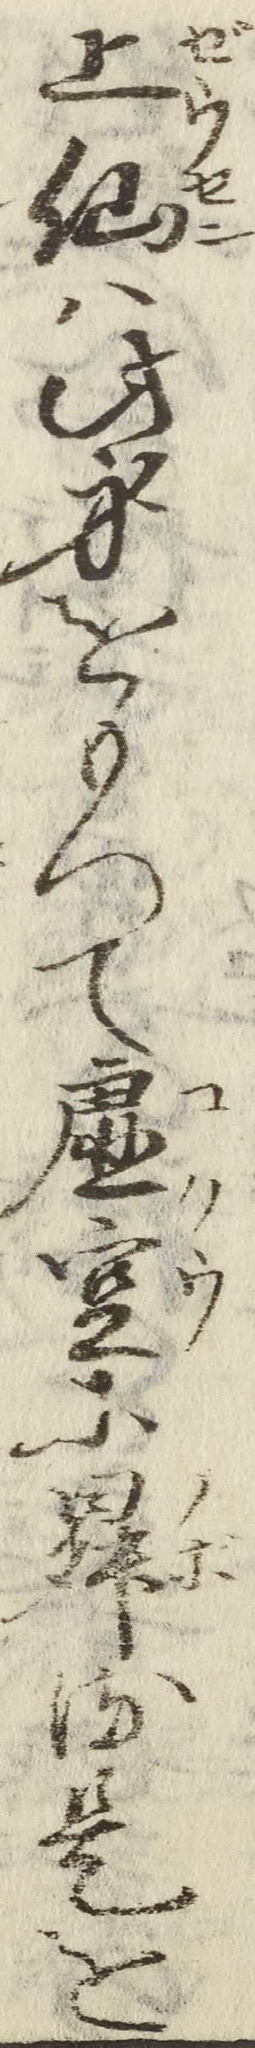上仙は此身をもつて虚空に昇る是を
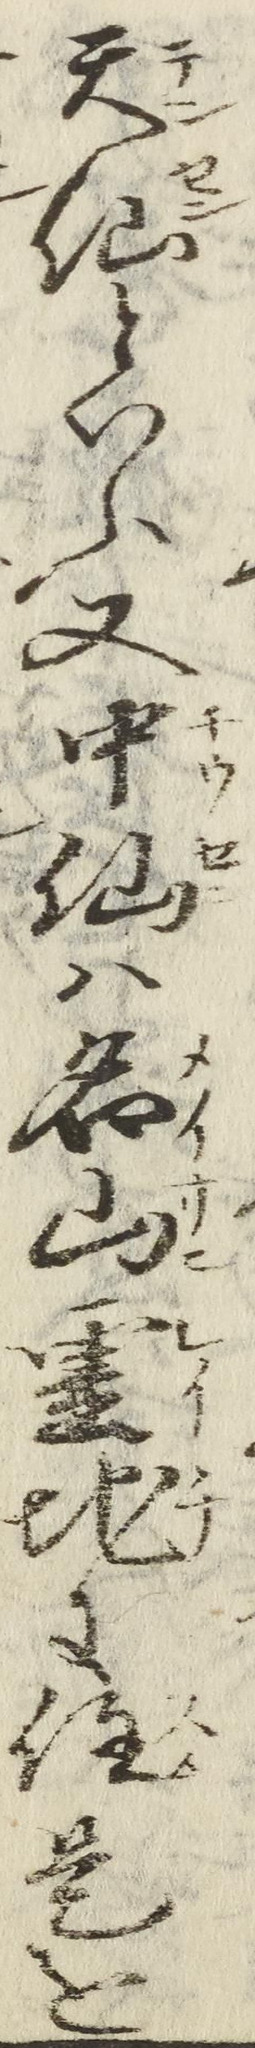天仙といふ又中仙は名山霊地に住是を
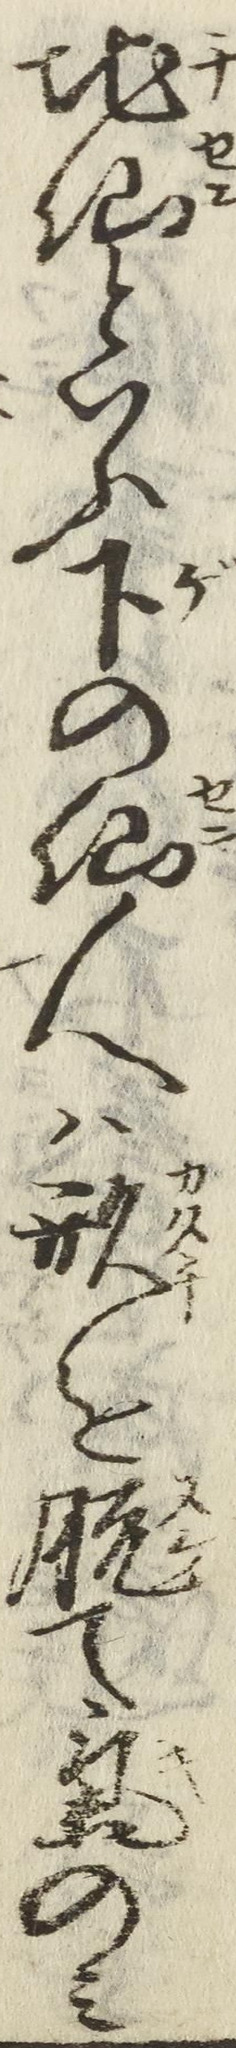地仙といふ下の仙人は形を脱て気のみ
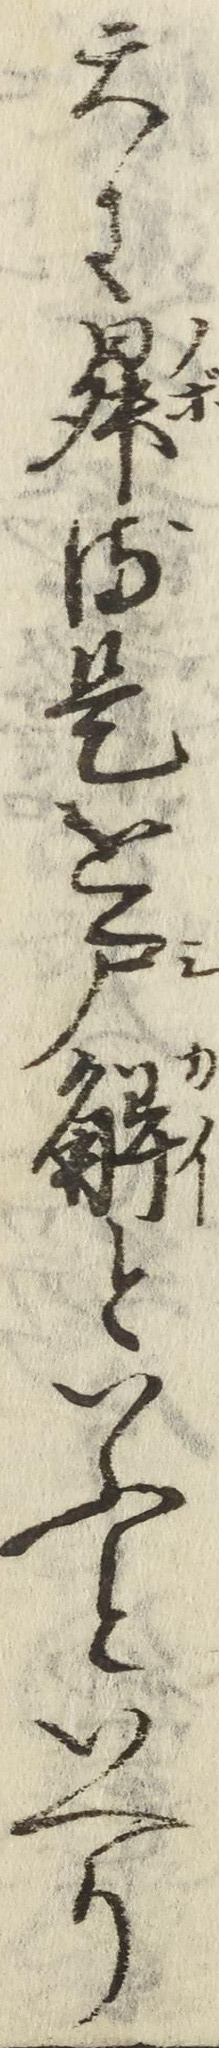天に昇る是を尸解といふといへり

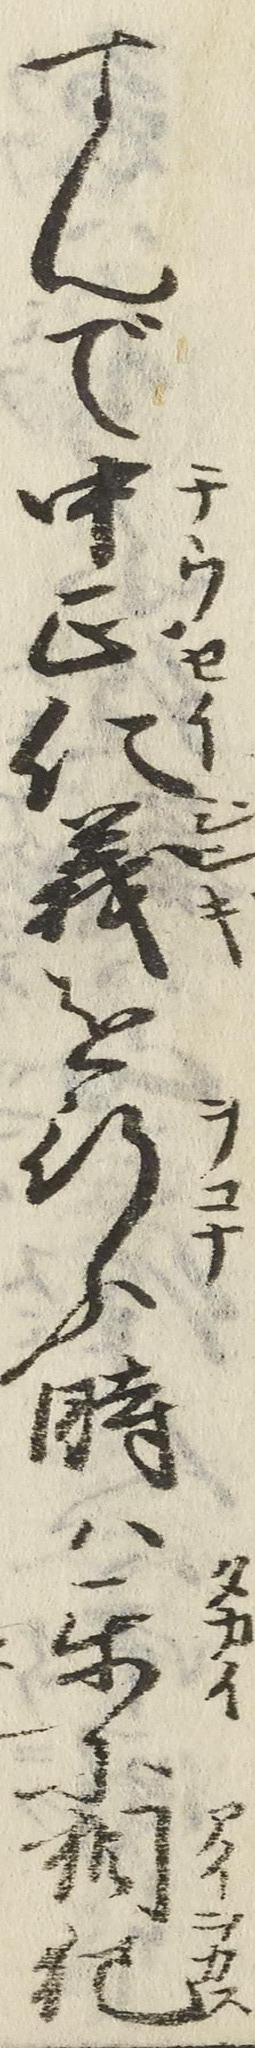すんで中正仁義を行ふ時は互に相犯
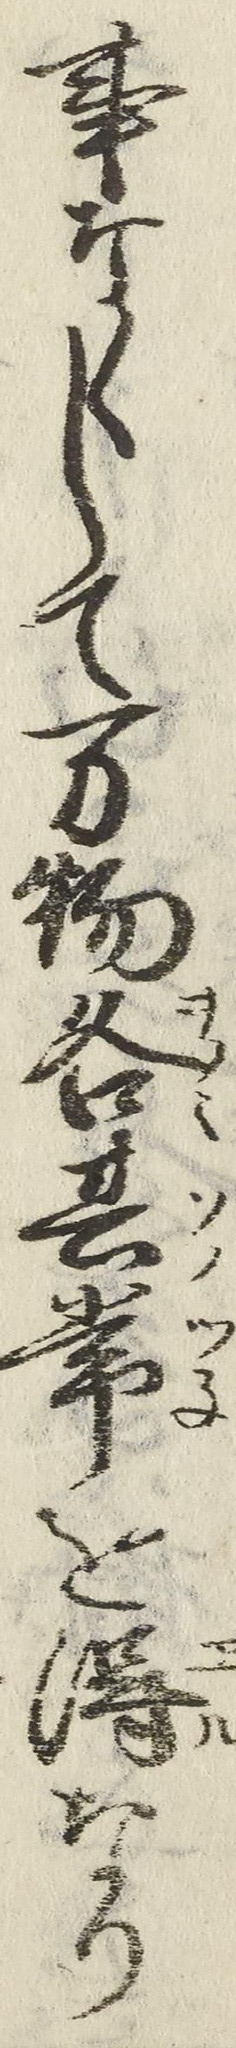事なくして万物各其常を得なり
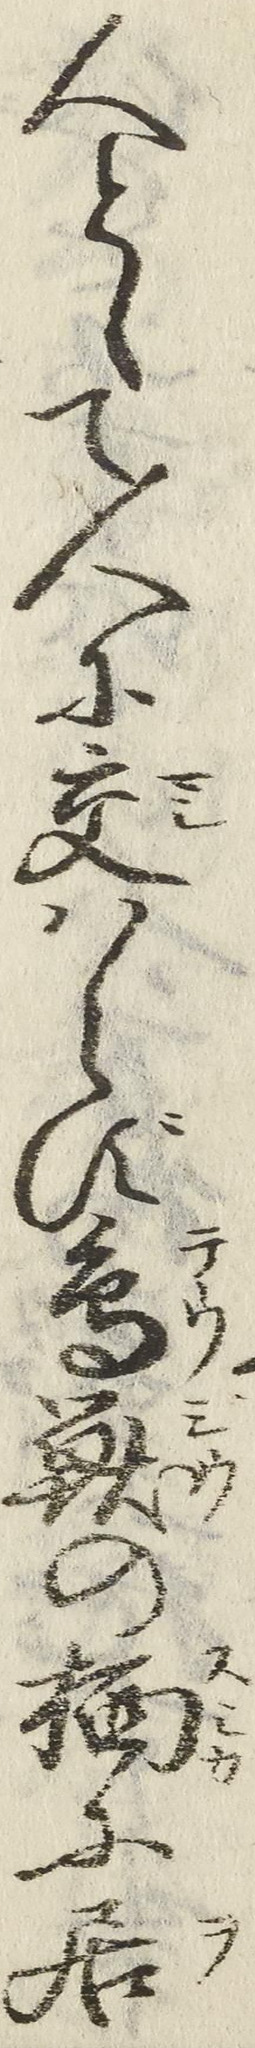人として人に交はらず鳥獣の栖に居
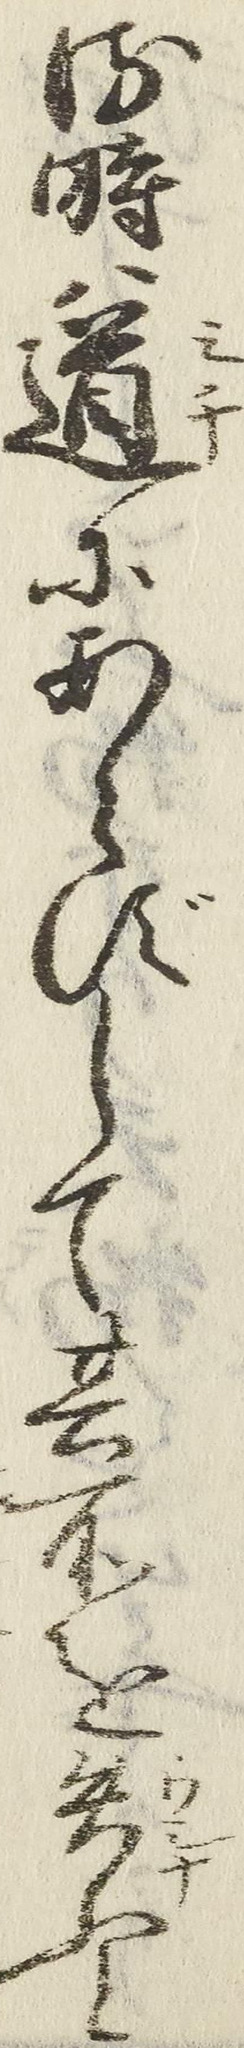る時は道にあらずして其所を失ふと
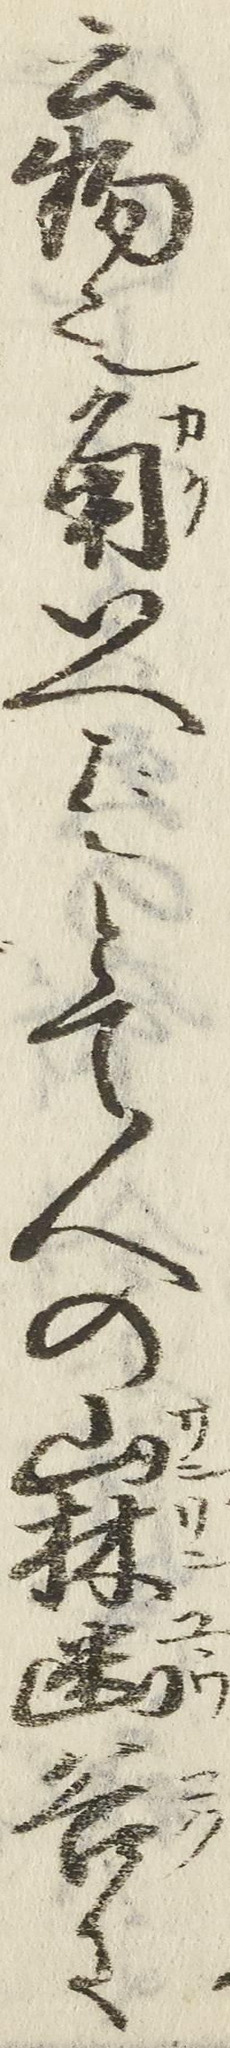云物也角いへばとて人の山林幽谷に
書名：天地或問珍　地
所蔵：東京大学地震研究所図書室 Earthquake Research Institute Library, The University of Tokyo, JAPAN
